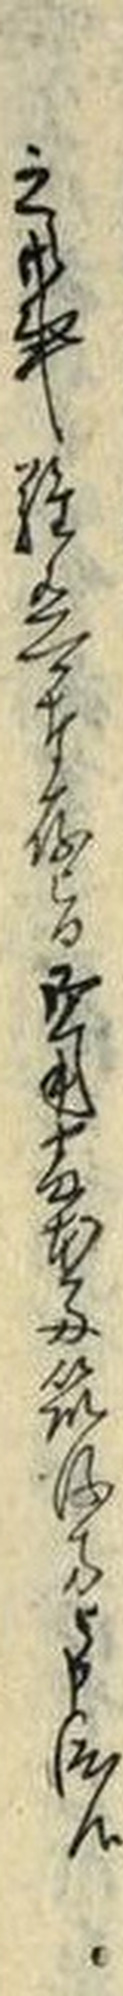之御事難有奉存候旨御用番本多筑後方被申渡候

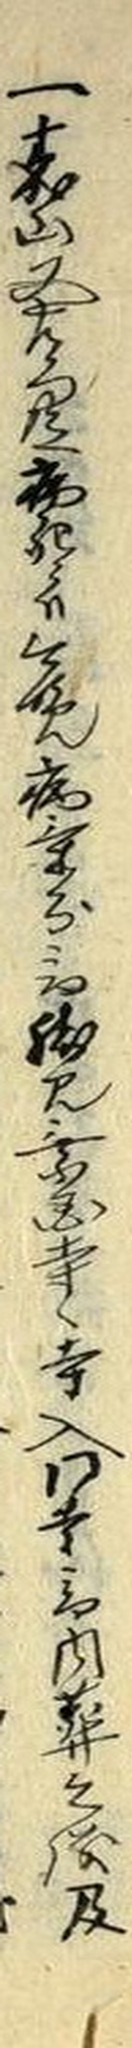一森山又左衛門殿病死ニ付今晩病気分ニ而勝見乗国寺へ寺入同寺ニ而内葬之儀及
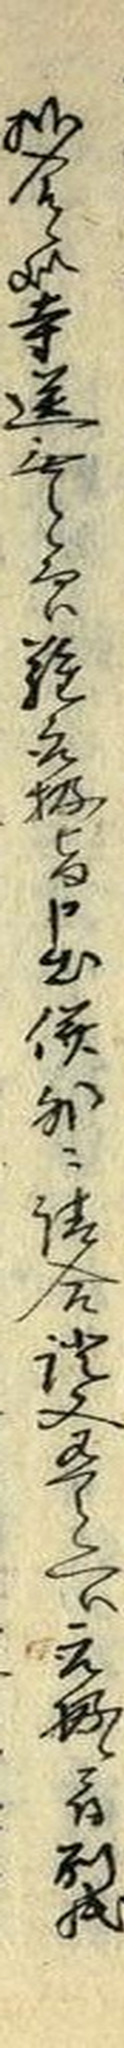掛合候処寺送無之候而ハ難取扱旨申出併外ニ請合証文有之候へハ取扱候ニ付別紙
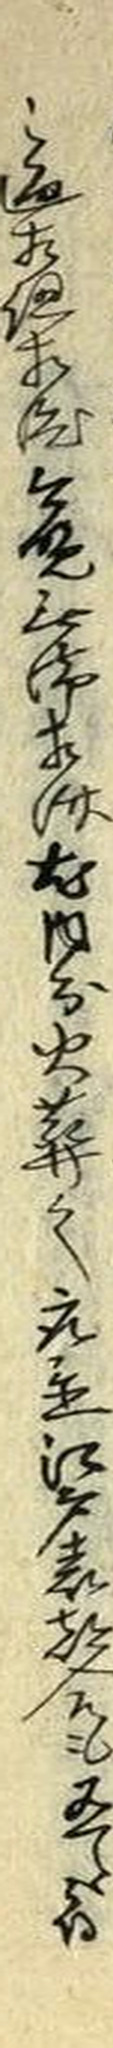之通相認相渡今晩無滞相済尤内分火葬之取置江戸表都合も有之候ニ付
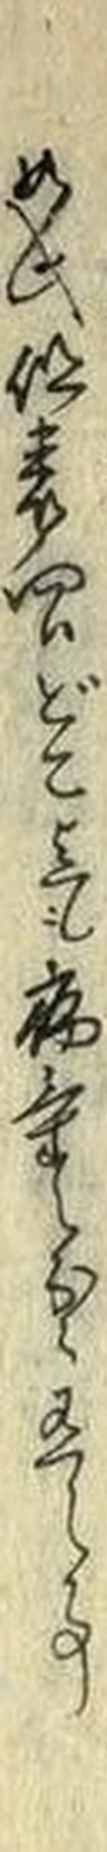如此但表向ハどこ迄も病気之分有之候事
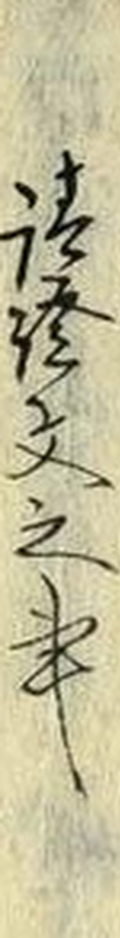請証文之事
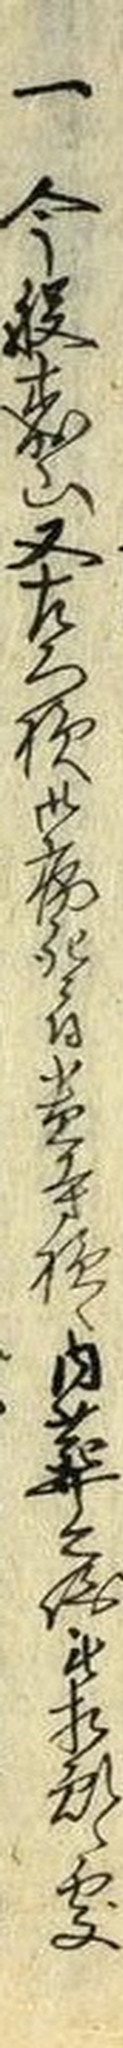一今般森山又左衛門様御病死ニ付貴寺様へ内葬之儀被相願候処
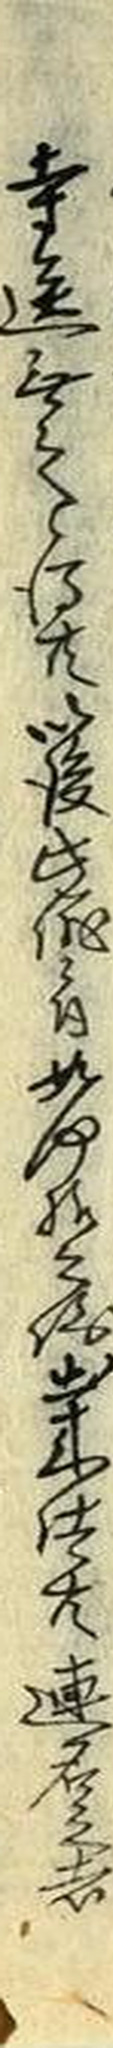寺送無之候得共以後此儀ニ付如何様之儀出来候共連名之者
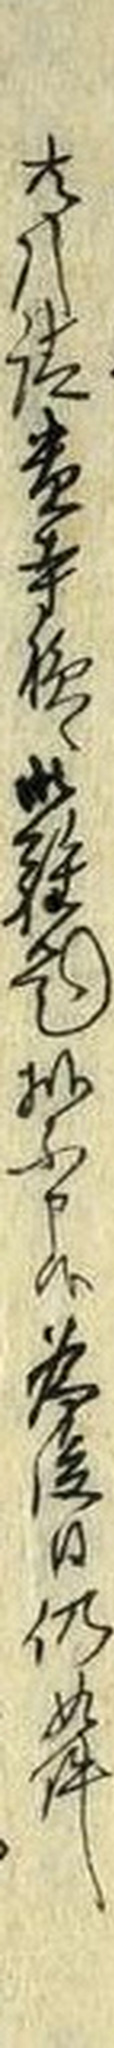共引請貴寺様へ御難題掛不申候為後日仍如件
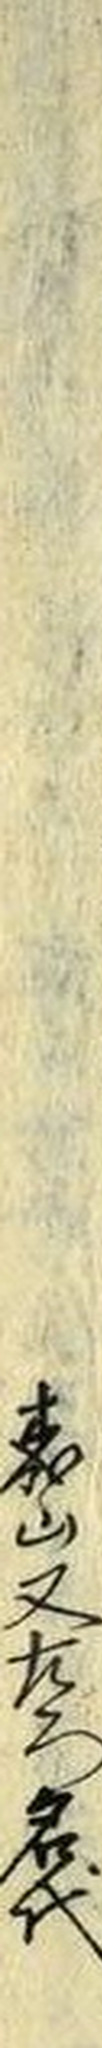森山又左衛門名代
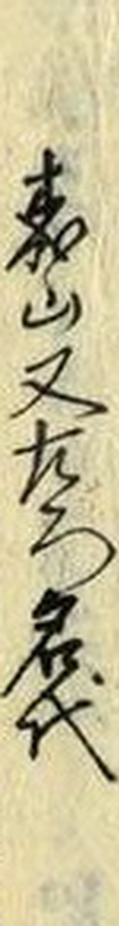森山又左衛門名代
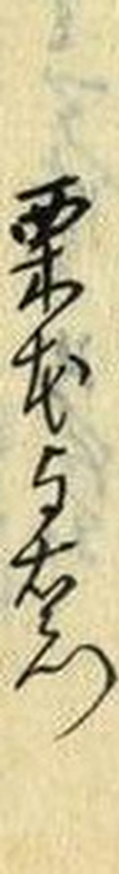栗本与右衛門
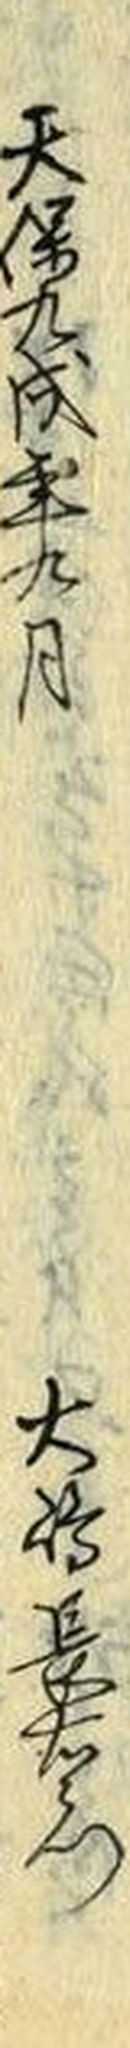天保九戌年九月大嶋長右衛門
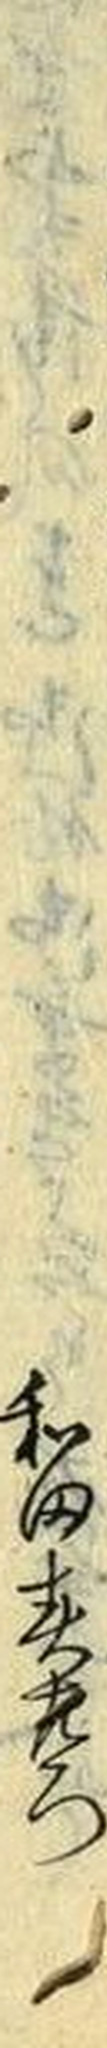和田春左衛門
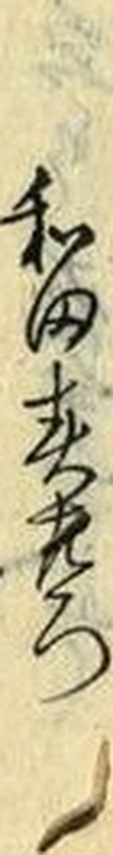和田春左衛門
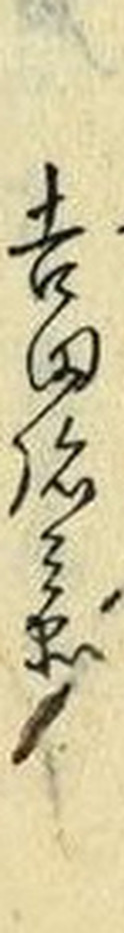吉田弥兵衛
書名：少傅日録抄（斉善付側向頭取日記、江戸并道中、初入在国、逝去後…
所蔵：福井県文書館 Fukui Prefectural Archives
